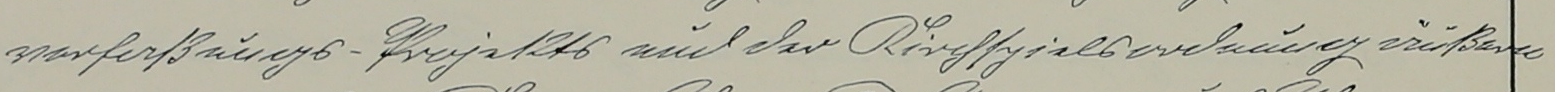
verfaßungs-Projekts und der Kirchspielsordnung äußern
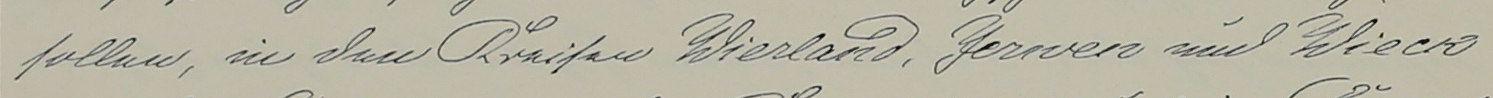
sollen, in den Kreisen Wierland, Jerwen und Wieck
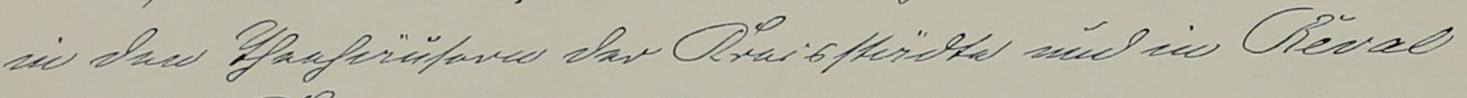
in den Theehäusern der Kreisstädte und in Reval
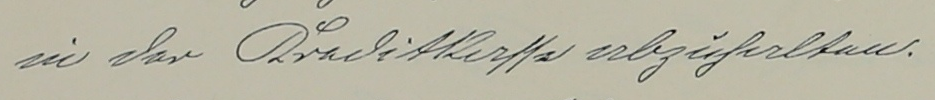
in der Kreditkasse abzuhalten.
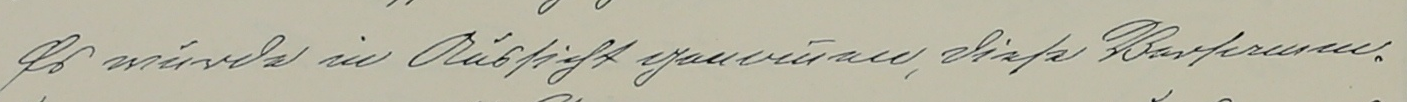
Es wurde in Aussicht genommen, diese Versamm-
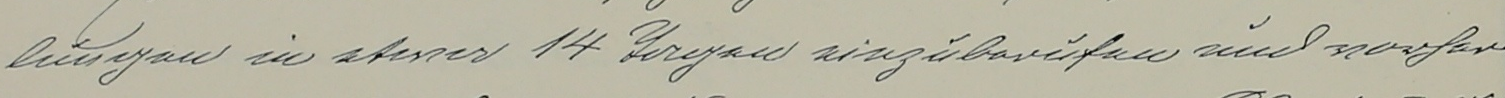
lungen in etwa 14 Tagen einzuberufen und vorher
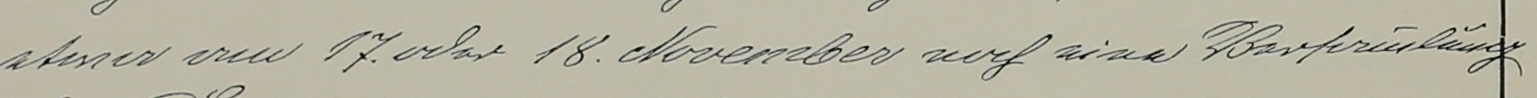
etwa am 17. oder 18. November noch eine Versammlung
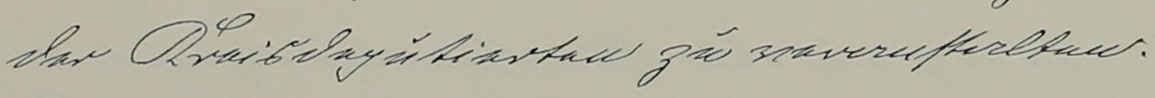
der Kreisdeputierten zu veranstalten.
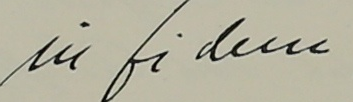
in fidem
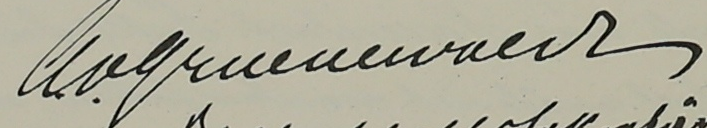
A.v.Gruenewaldt
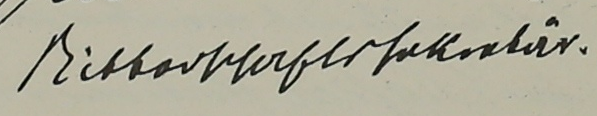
Ritterschaftssekretär
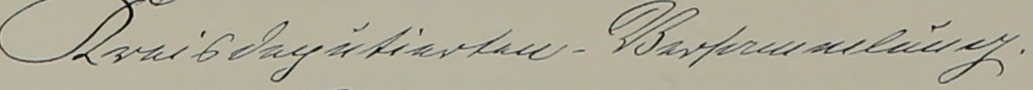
Kreisdeputierten-Versammlung.
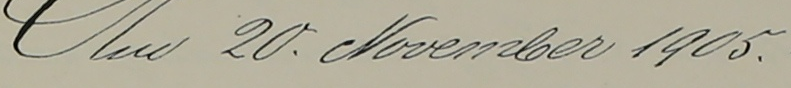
Am 20. November 1905.
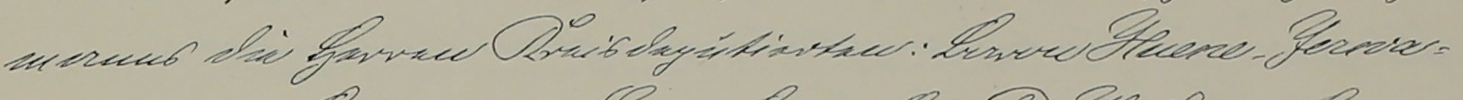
manns die Herren Kreisdeputierten: Baron Huene-Jerwa-
